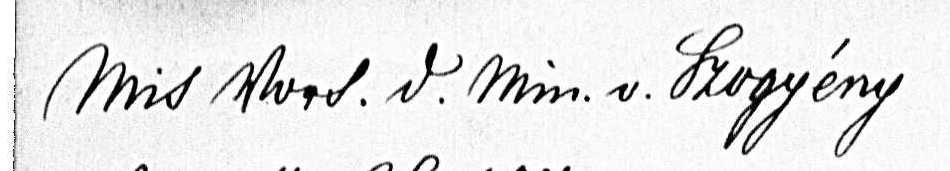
Mit Vort. d. Min. v. Szogyény
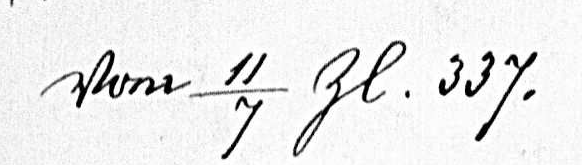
Vom 11/7 Z. 337
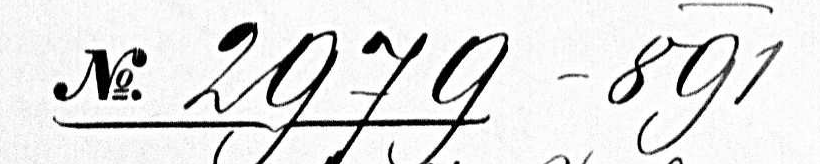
No. 2979 – 1891
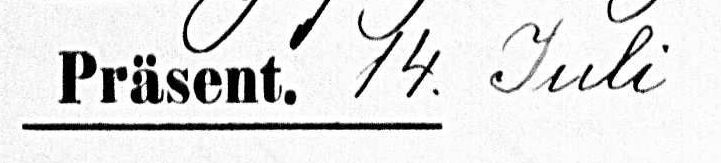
Präsent. 14. Juli
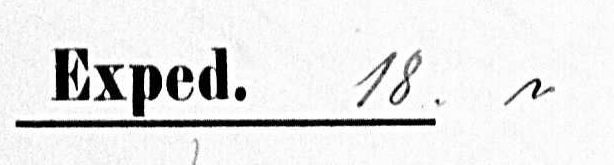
Expedit 18. „
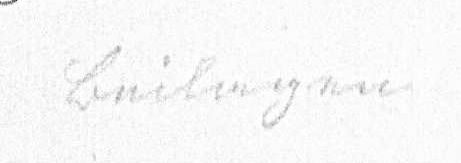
Beilagen
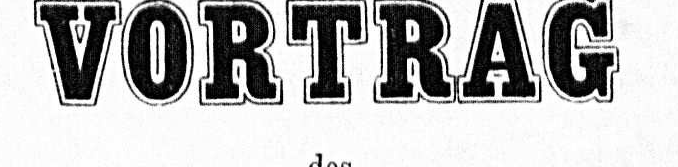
VORTRAG
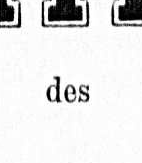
Des
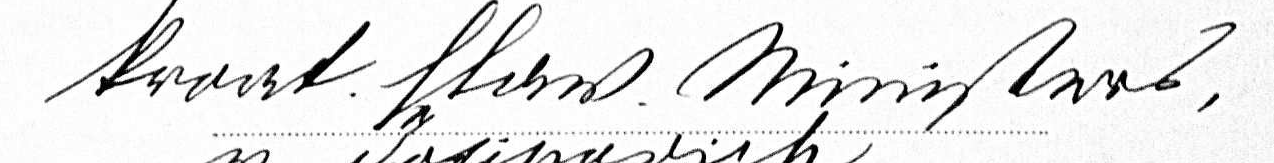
kroat. slaw. Ministers,
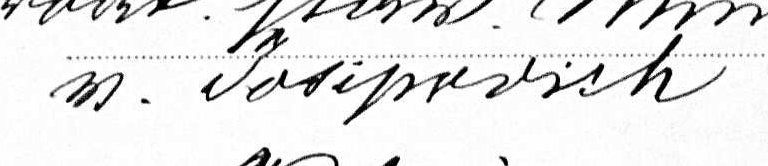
v. Josipovich
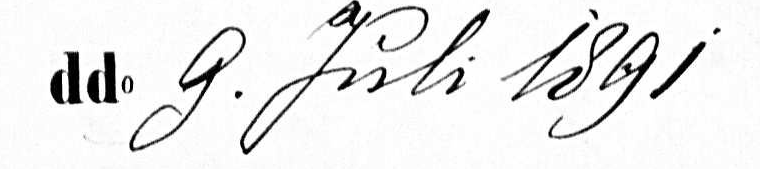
ddo 9 Juli 1891
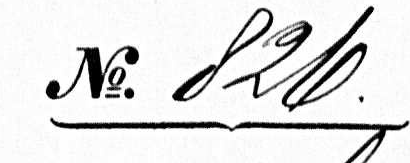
No 826
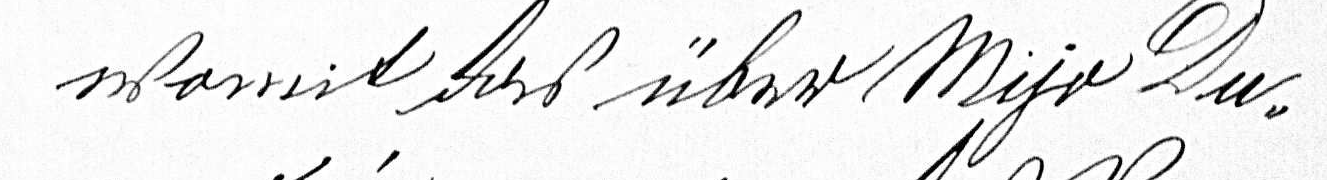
womit das über Mijo Du¬
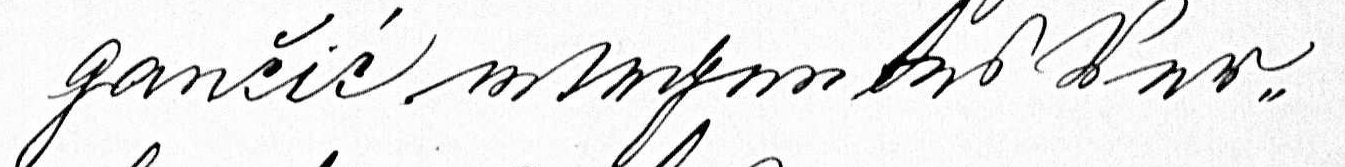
gančić wegen des Ver¬
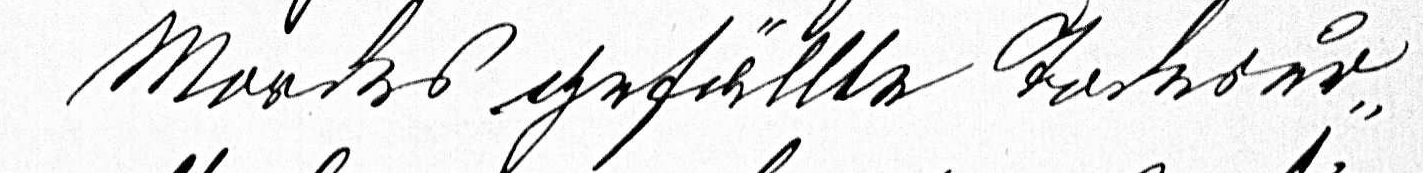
Mordes gefällte Todesur¬
